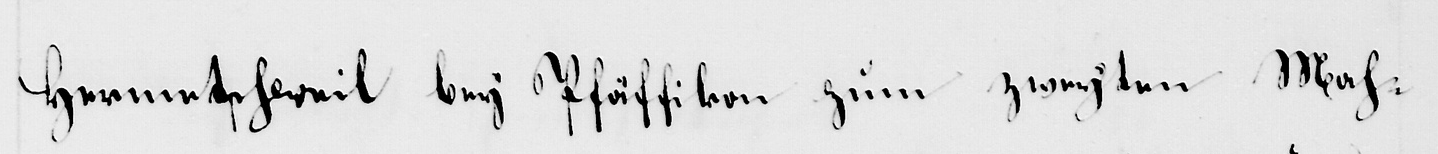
Hermetschweil bey Pfäffikon zum zweyten Mah¬
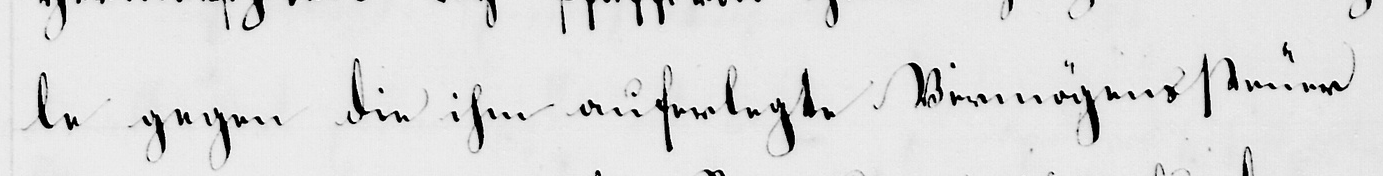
le gegen die ihm auferlegte Vermögenssteuer
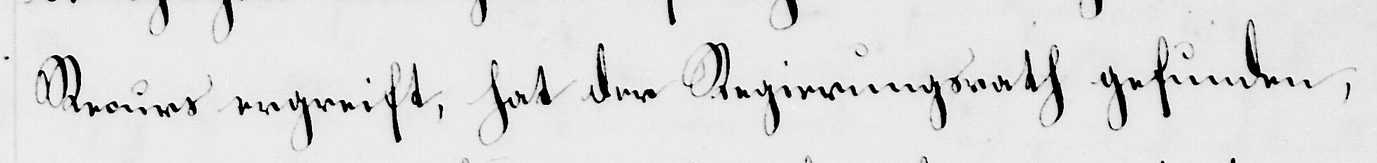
Recurs ergreift, hat der Regierungrath gefunden,
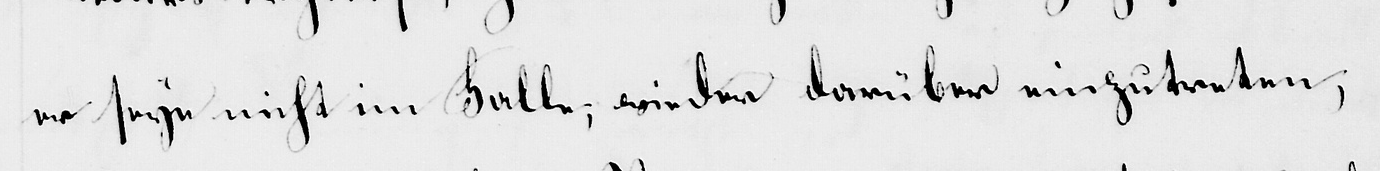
er seye nicht im Falle, wieder darüber einzutreten,
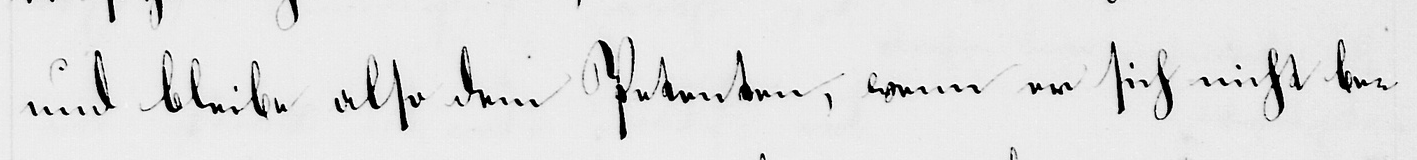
und bleibe also dem Petenten, wenn er sich nicht be¬
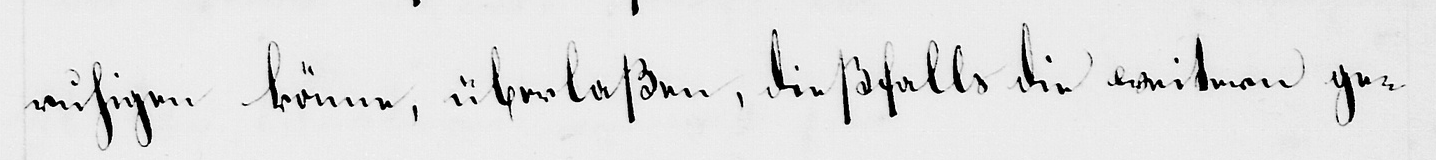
ruhigen könne, überlaßen, dießfalls die weiteren ge¬
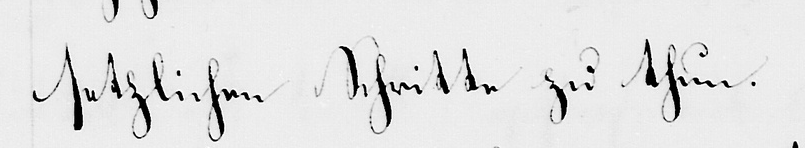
setzlichen Schritte zu thun.
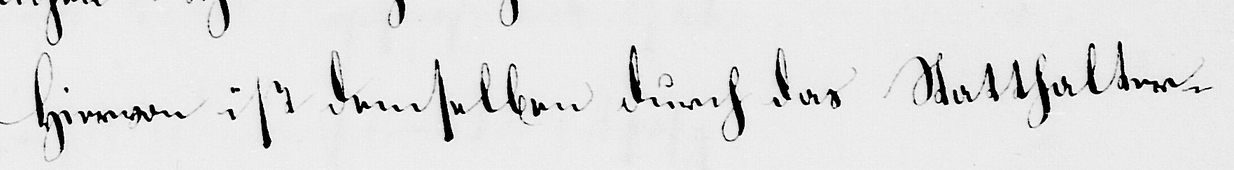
Hiervon ist demselben durch das Statthalter¬
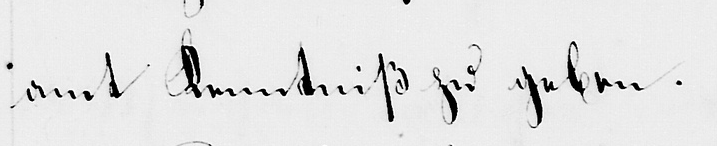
amt Kenntniß zu geben.
